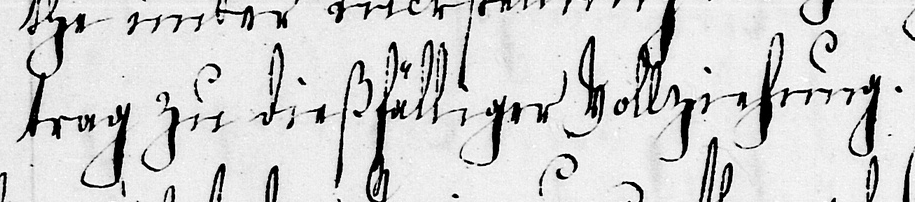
trag zu dießfälliger Vollziehung.
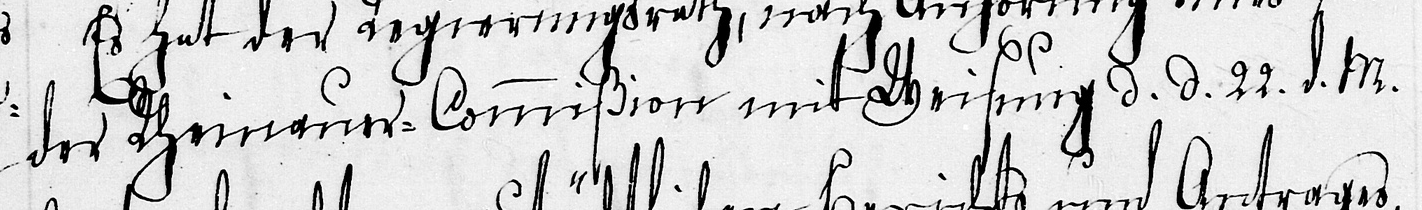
der Rheinauer-Commißion mit Weisung d. d. 22. d. M.
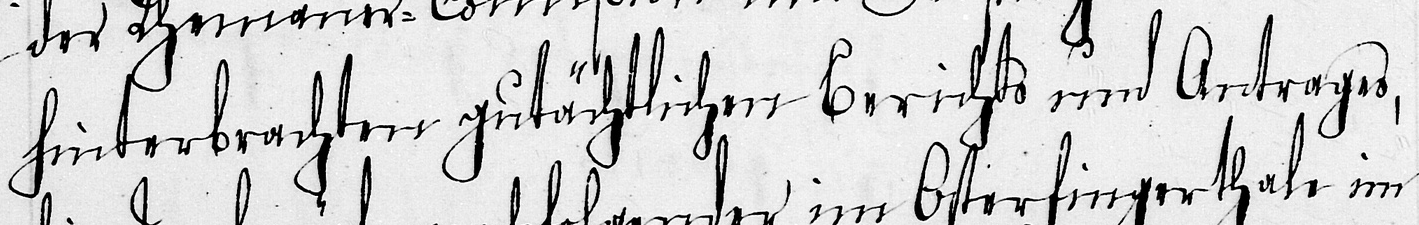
hinterbrachten gutächtlichen Berichts und Antrages,
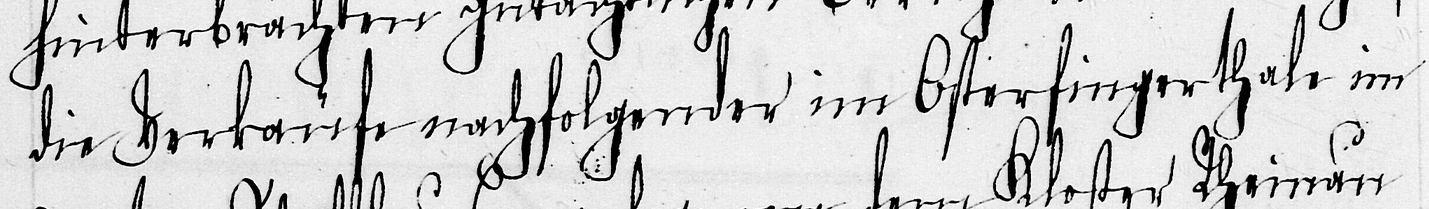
die Verkäufe nachfolgender im Osterfingerthale im
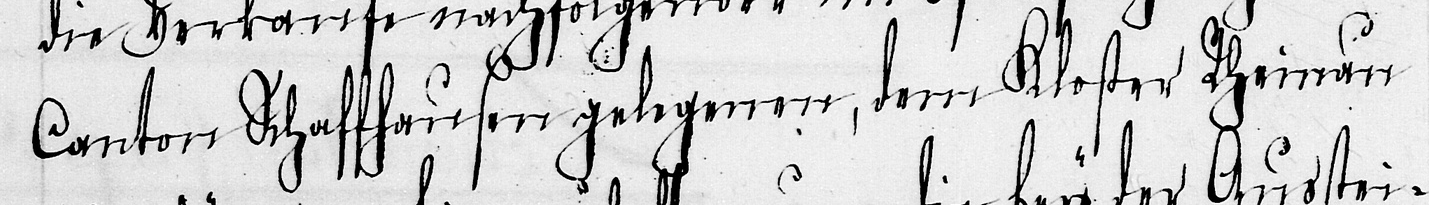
Canton Schaffhausen gelegenen, dem Kloster Rheinau
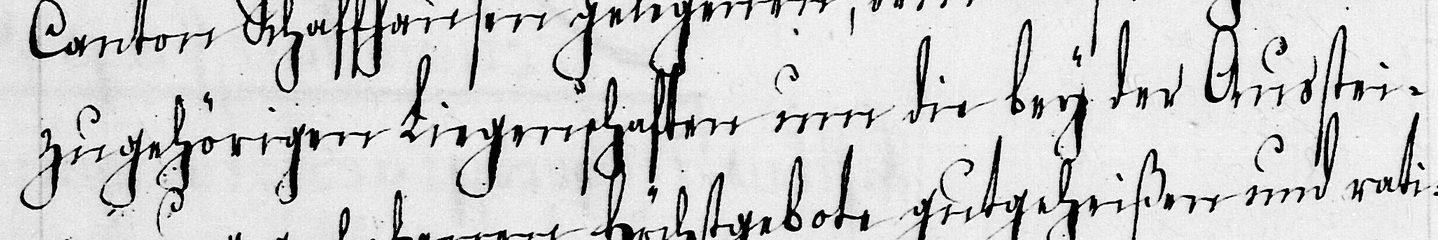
zugehörigen Liegenschaften um die bey der Ausstei¬
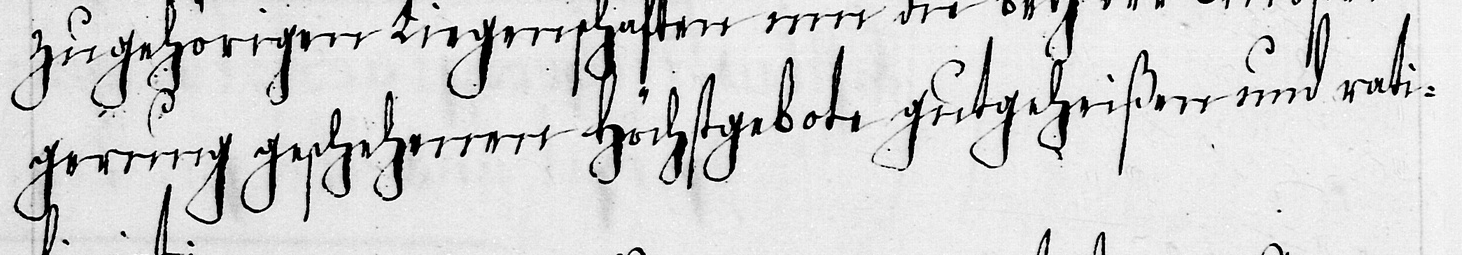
gerung geschehenen Höchstgebote gutgeheißen und rati¬
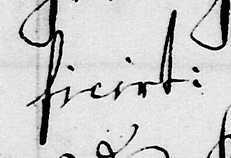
ficirt:
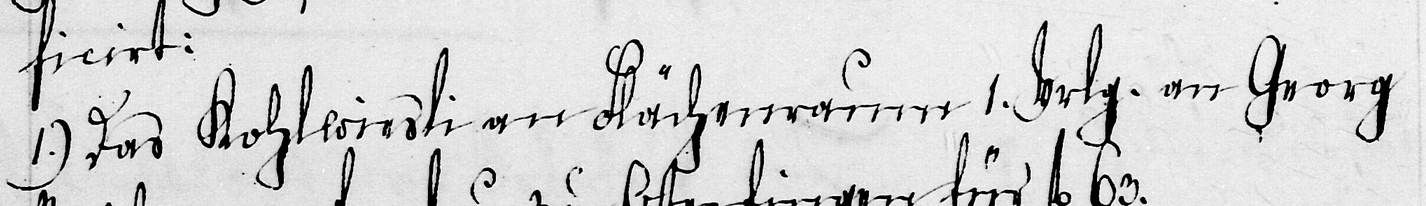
1.) Das Kohlwiesli an Flächenraum 1. Vrlg. an Georg
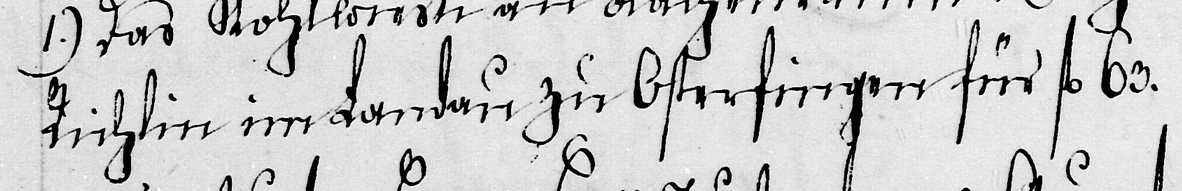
Richlin im Landau zu Osterfingen für fl. 63.
